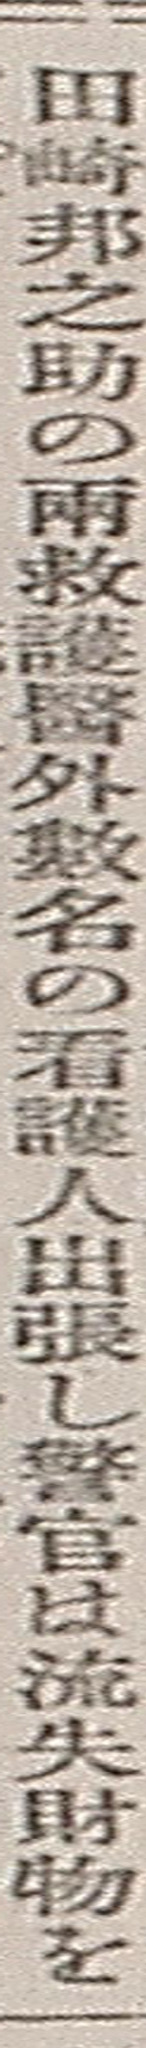田崎邦之助の両救護医外数名の看護人出張し警官は流失財物を
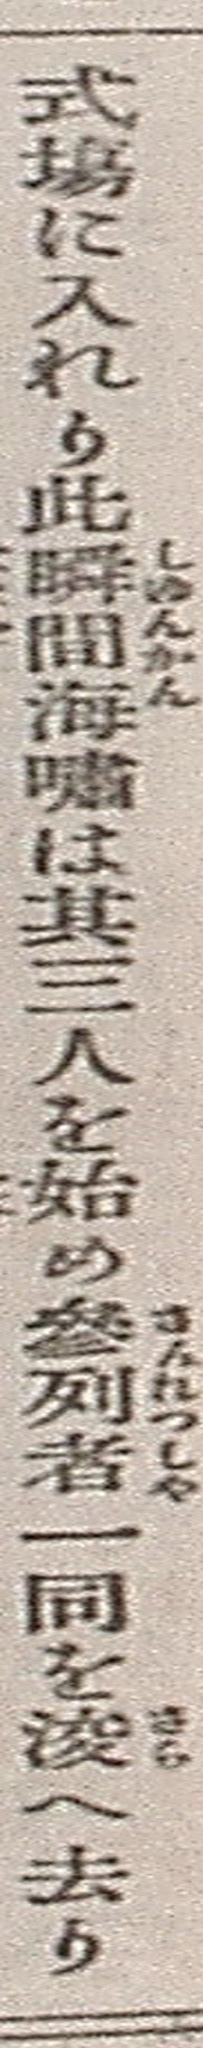式場に入れり此瞬間海嘯は其三人を始め参列者一同を浚へ去り
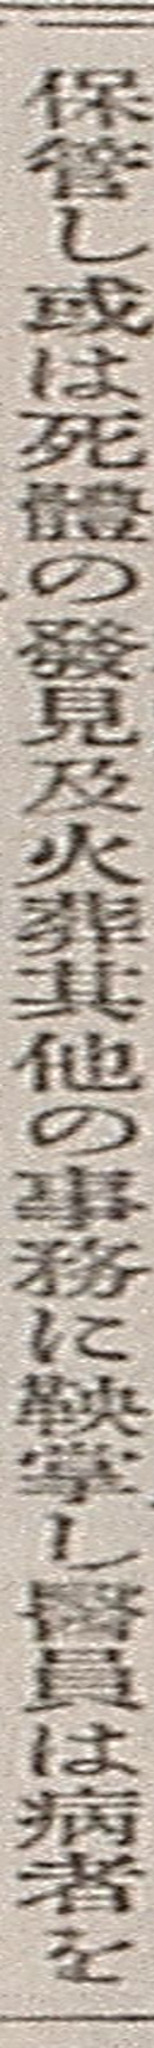保管し或は死体の発見及火葬其他の事務に鞅掌し医員は病者を
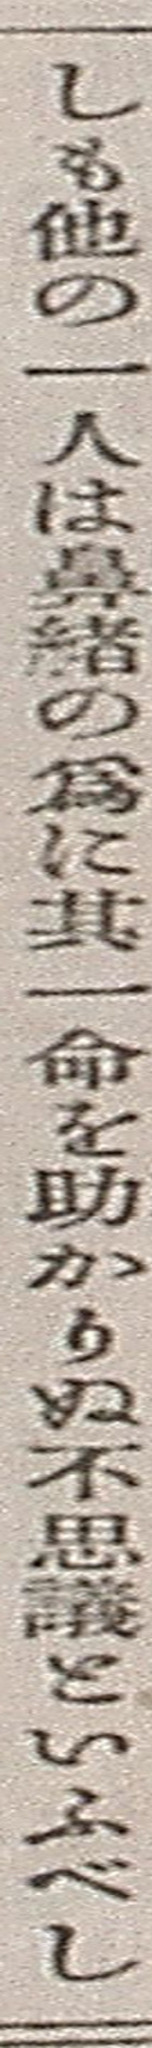しも他の一人は鼻緒の為に其一命を助かりぬ不思議といふべし
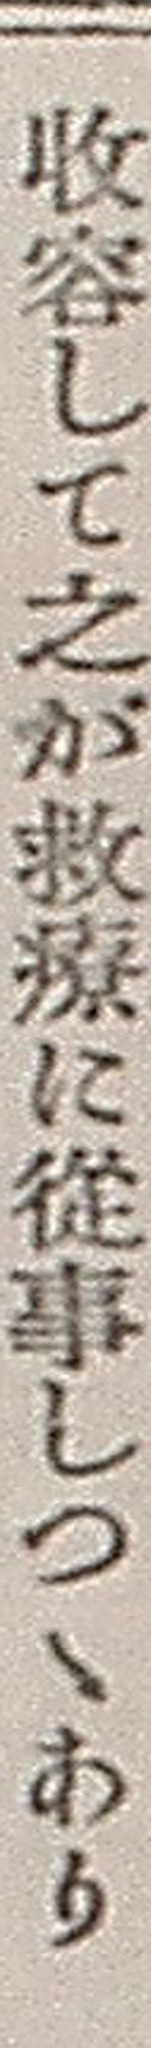収容して之が救療に従事しつゝあり
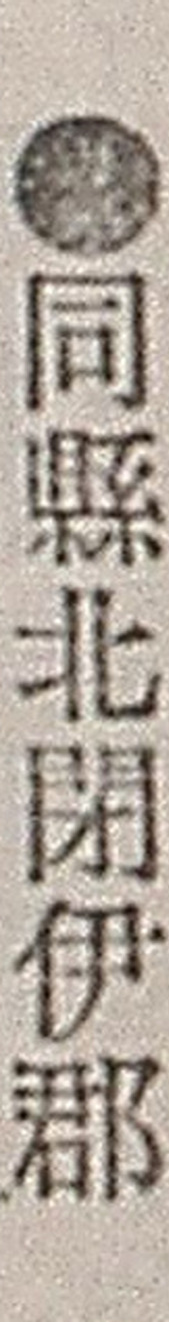●同県北閉伊郡
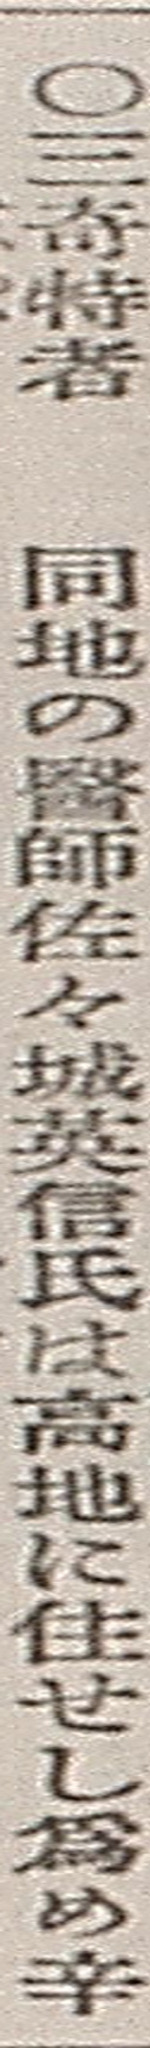○三奇特者同地の医師佐々城英信氏は高地に住せし為め辛
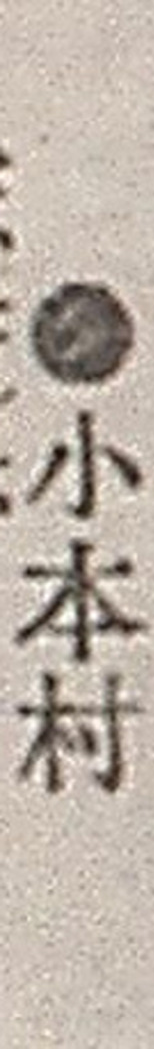●小本村
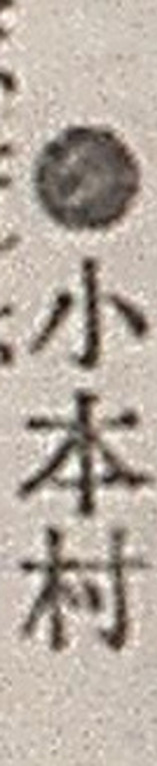●小本村
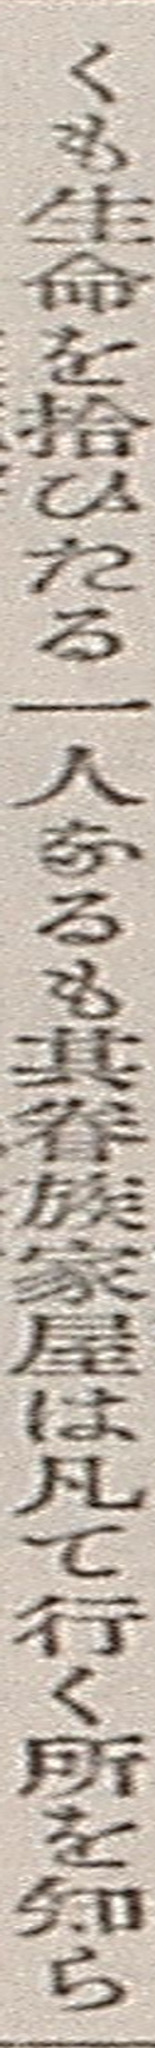くも生命も拾ひたる一人なるも其眷族家屋は凡て行く所を知ら
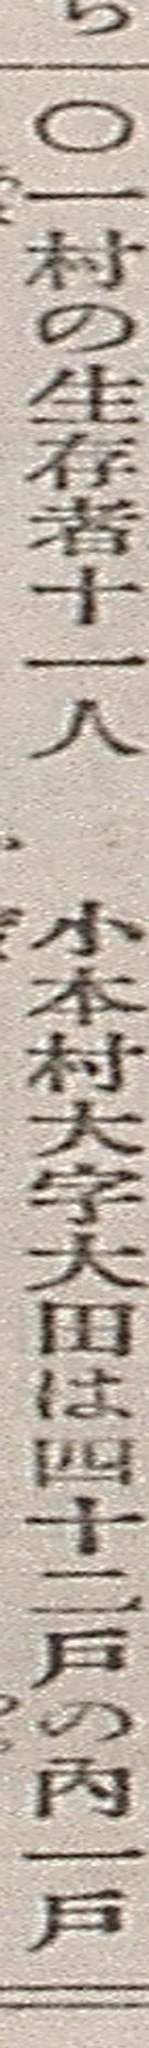○一村の生存者十一人小本村大字大田は四十二戸の内一戸
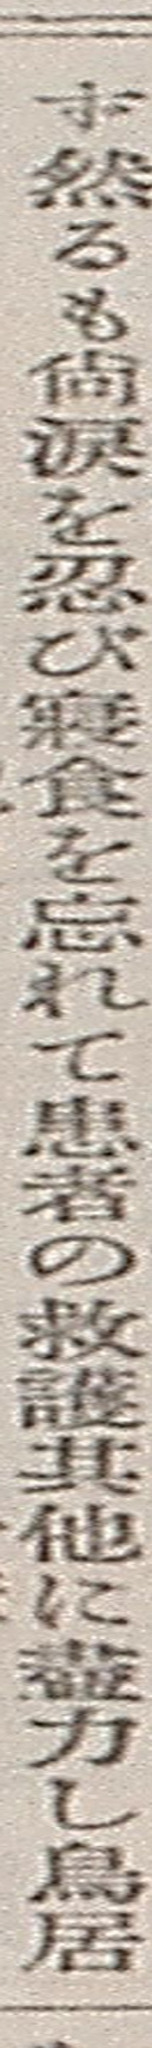ず然るも尚涙を忍び寝食を忘れて患者の救護其他に尽力し鳥居
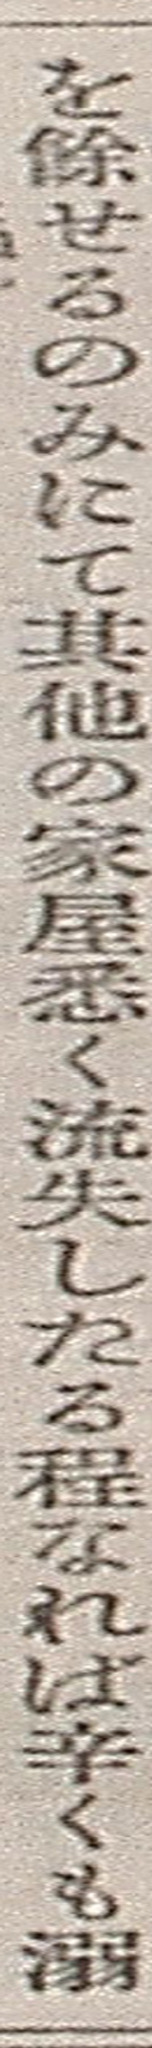を余せるのみにて其他の家屋悉く流失したる程なれば辛くも溺
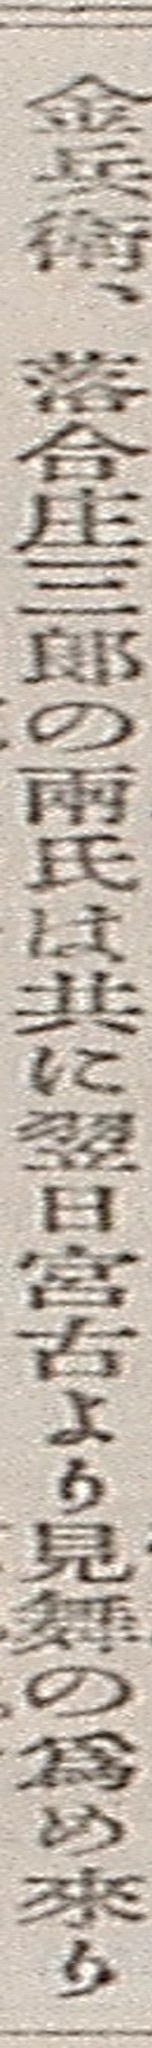金兵衛、落合庄三郎の両氏は共に翌日宮古より見舞の為め来り
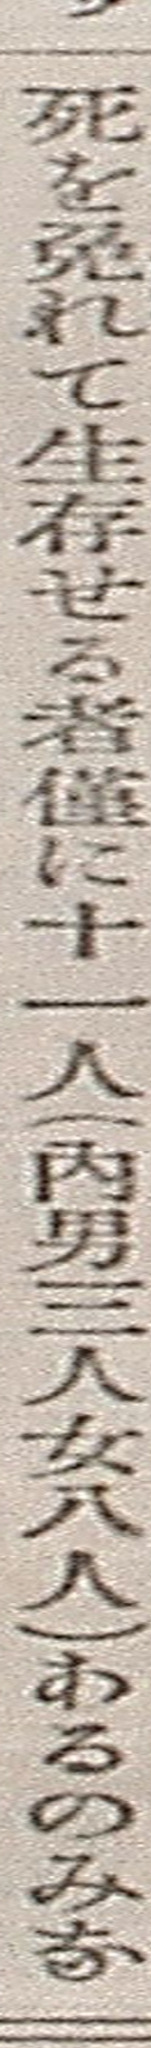死を免れて生存せる者僅に十一人あるのみな
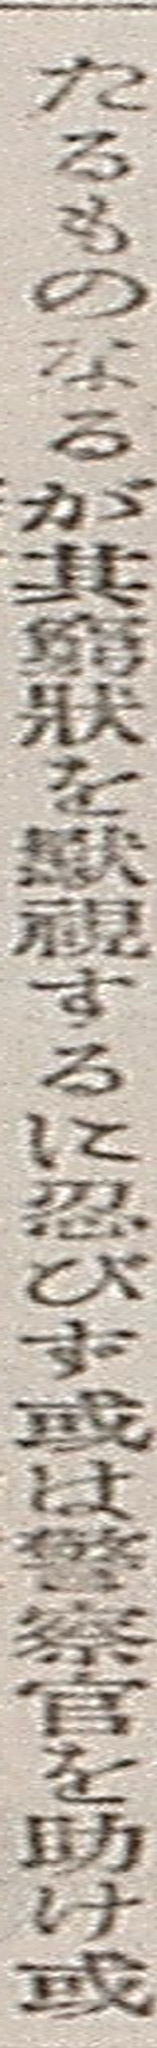たるものなるが其窮状を黙視するに忍びず或は警察官を助け或
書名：風俗畫報臨時増刊第百十九號　大海嘯被害録（中）
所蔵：東京大学地震研究所図書室 Earthquake Research Institute Library, The University of Tokyo, JAPAN
